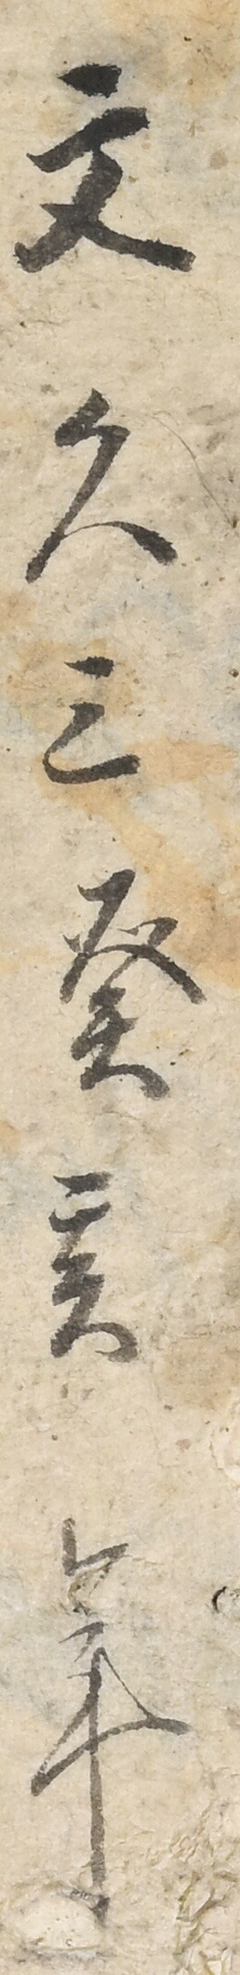文久三癸亥年
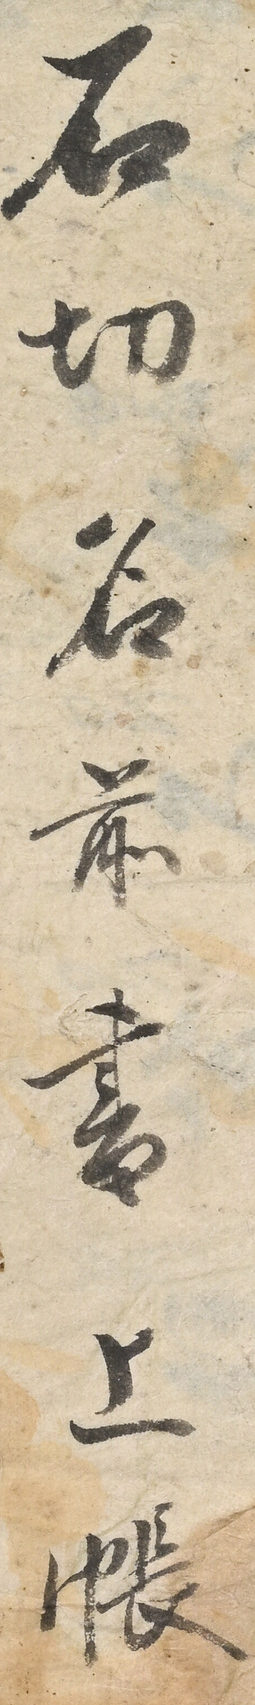石切名前書上帳
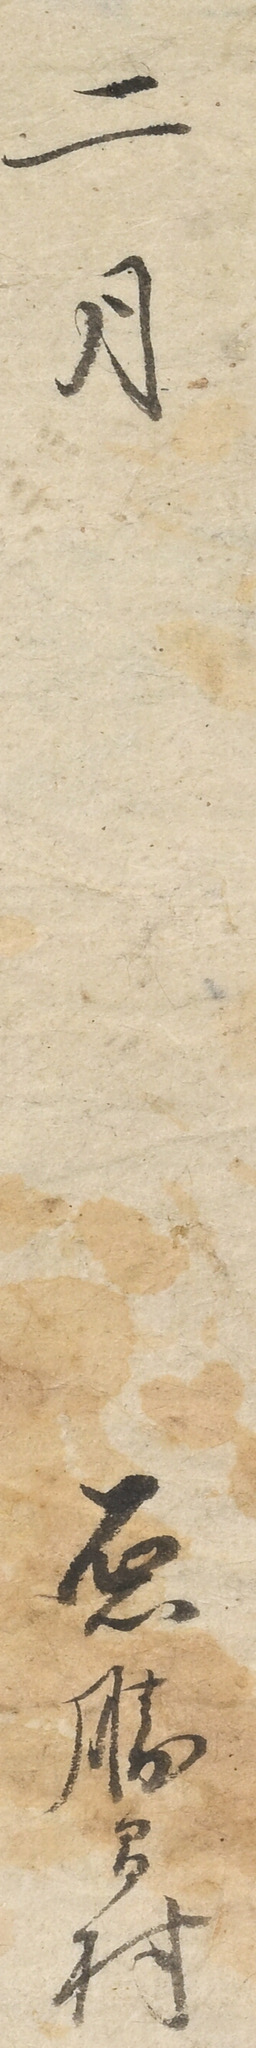二月原勝間村

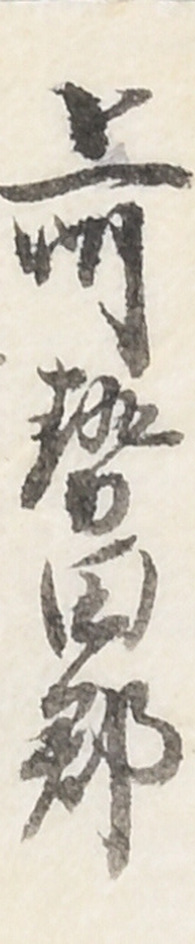上州勢田郡
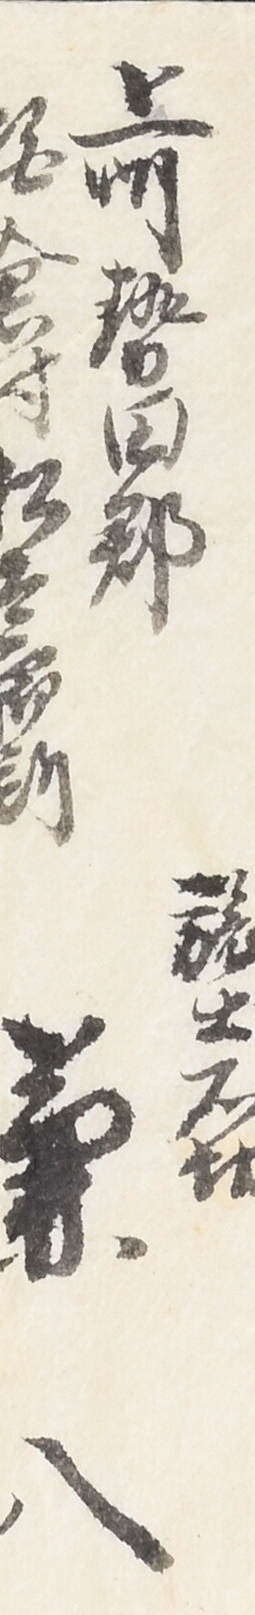上州勢田郡

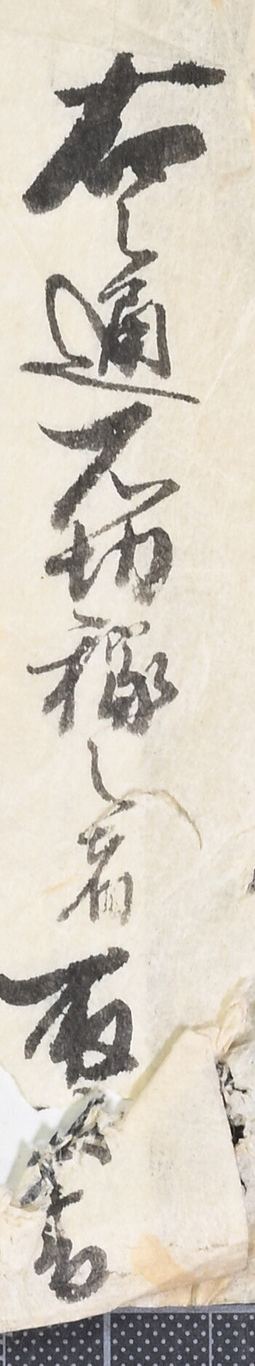右之通石切稼之者取書
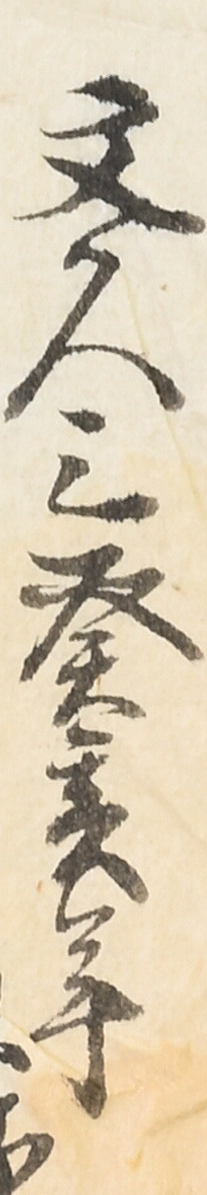文久三癸亥年
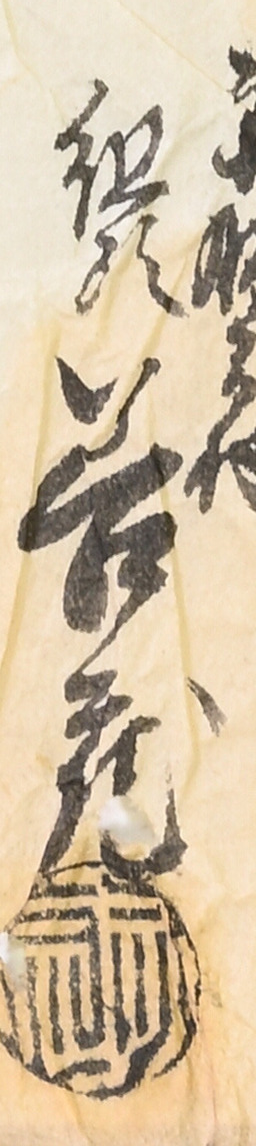組頭善蔵㊞
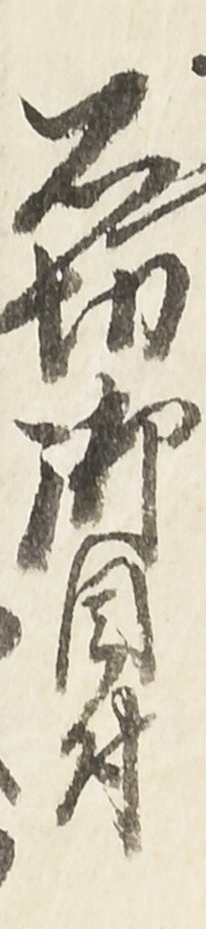石切御目付
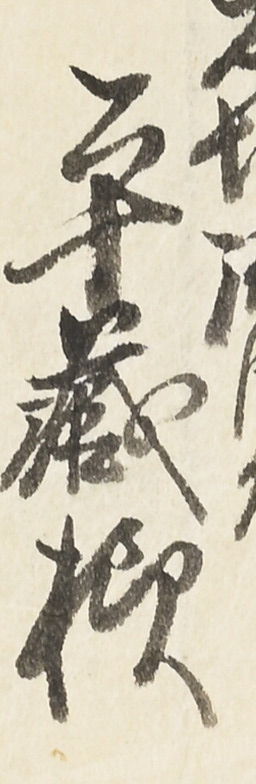平蔵様
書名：文久三癸亥年二月石切名前書上帳
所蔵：伊那市立高遠町図書館・合同会社AMANE
